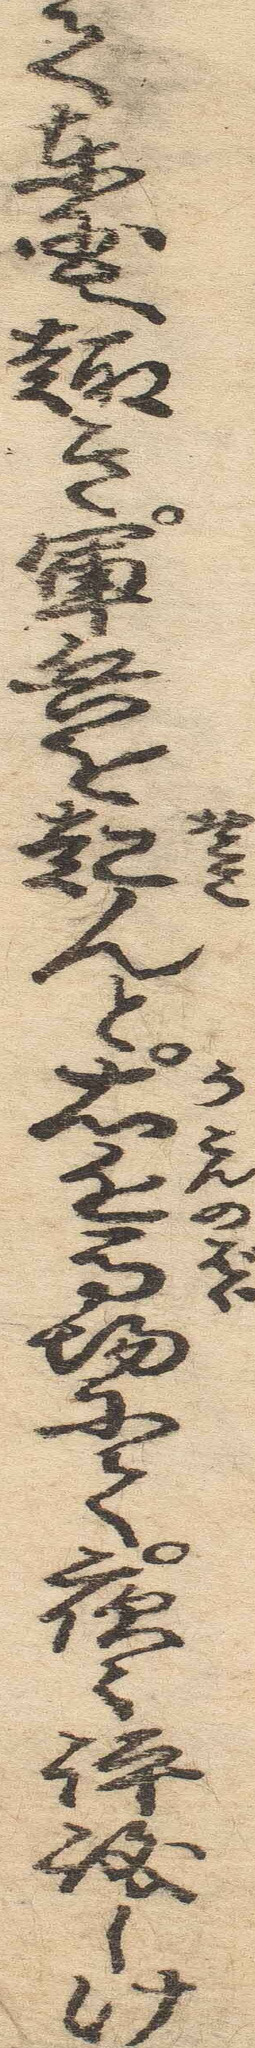て東国へ趣き。軍兵を起んと。右近馬場にて。夜々評儀しけ
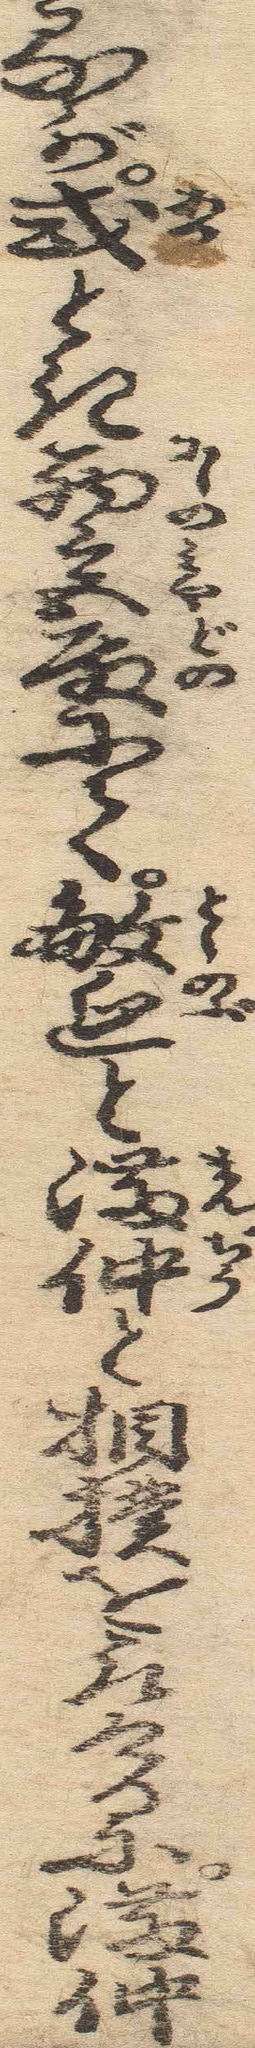るが。或とき西宮殿にて敏延と満仲と相撲を取けるに。満仲
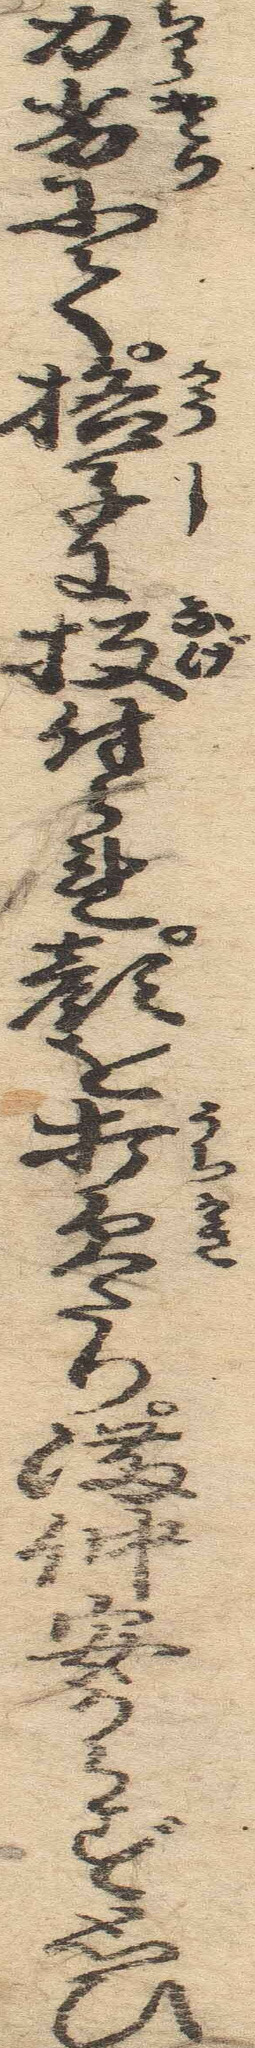力劣にて格子に投付られ。顔を打欠たり。満仲安からず思ひ
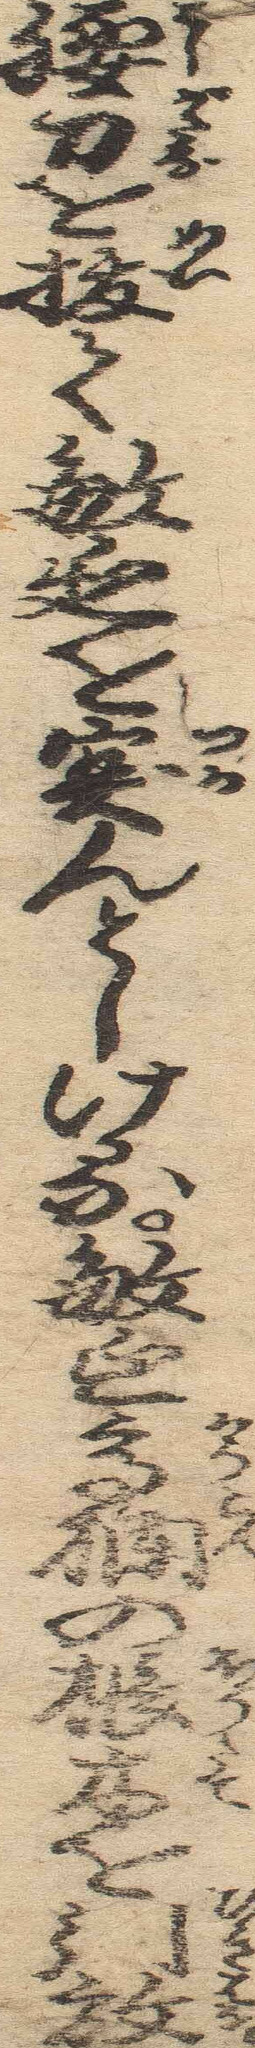腰刀を抜て敏延を突んとしける。敏延高欄の根木を引放
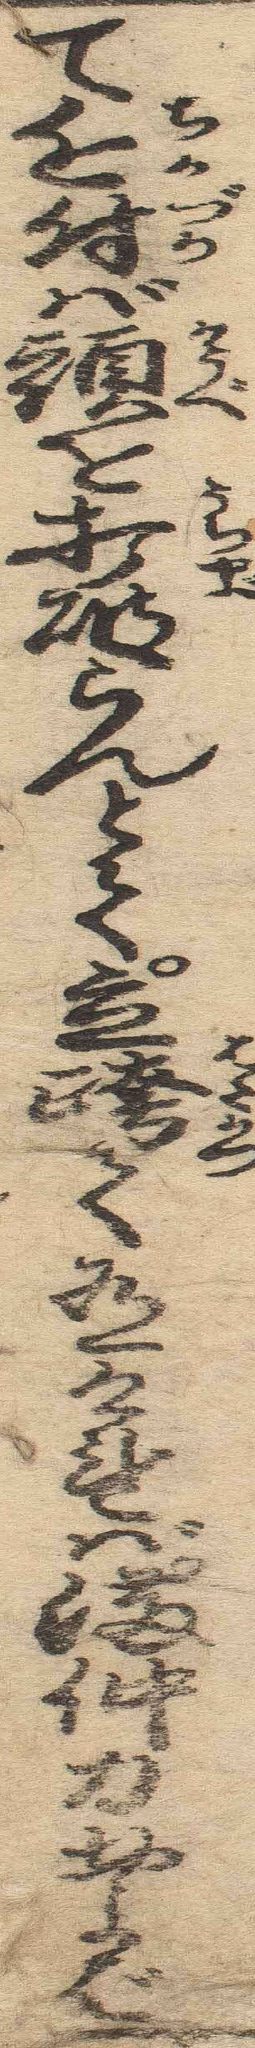て近付ば頭を打破らんとて。立跨て有ければ。満仲力およば
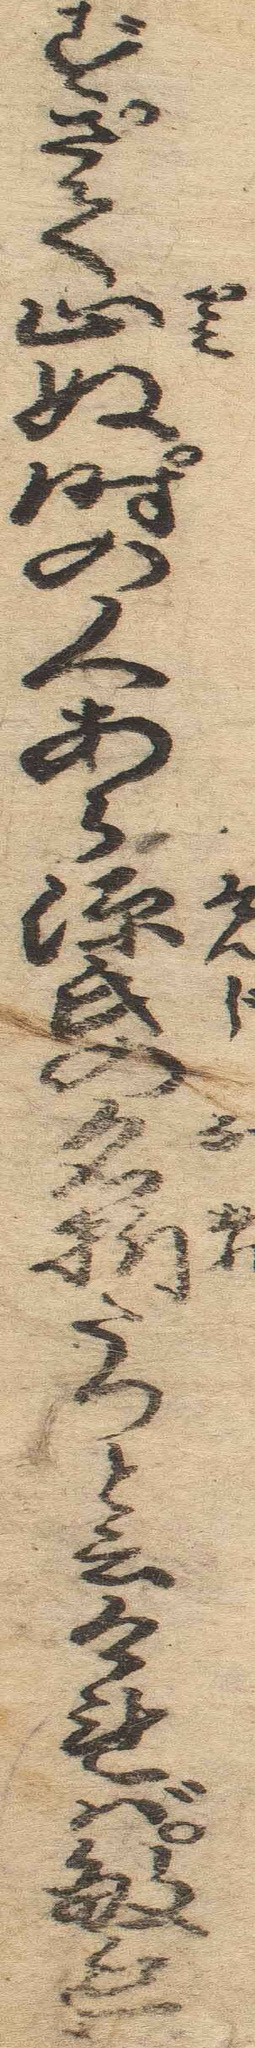ず。さて止ぬ。時の人あゝ源氏の名折たりと云ければ。敏延を失
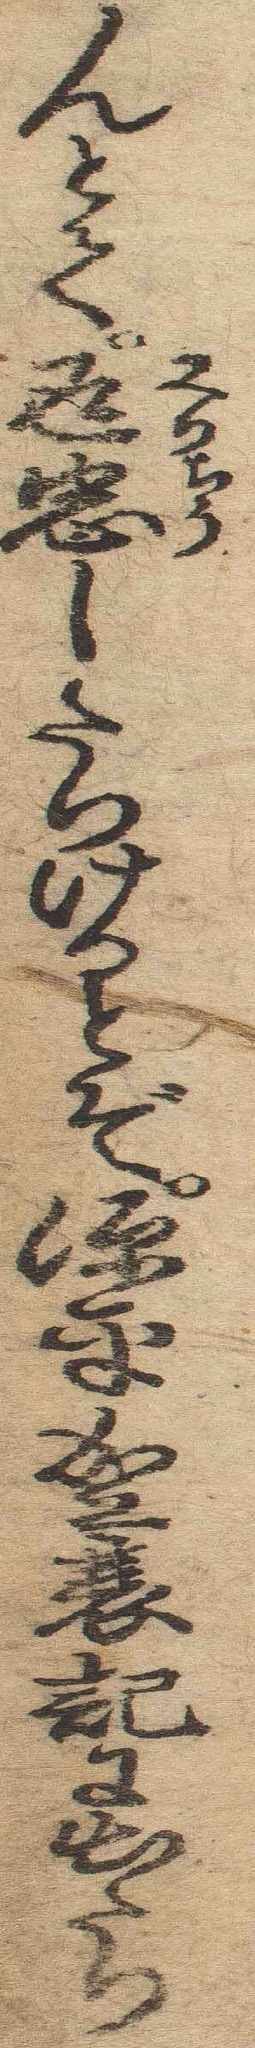んとて。返忠したりけるとぞ源平盛衰記に出たり

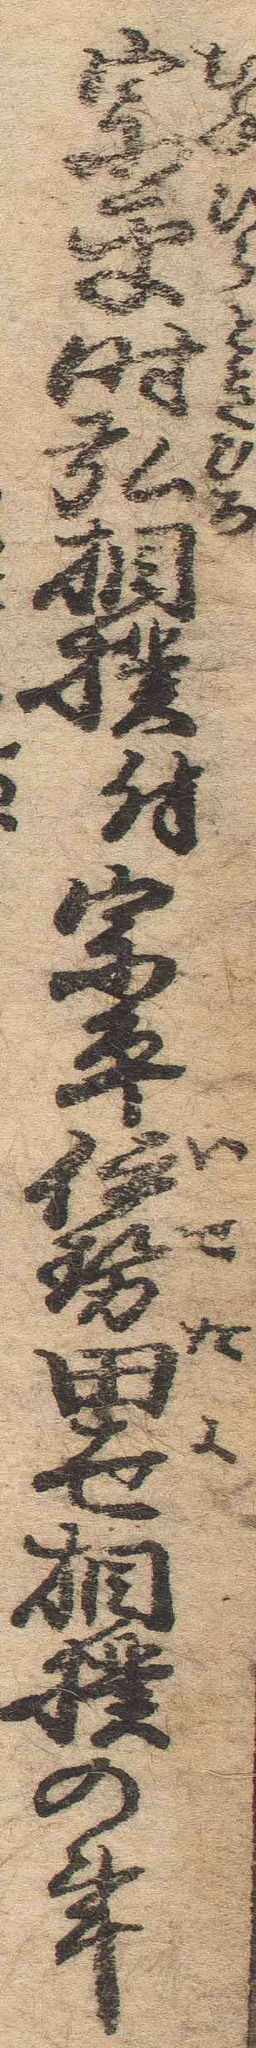宗平時弘相撲付宗平伊勢田世相撲の事
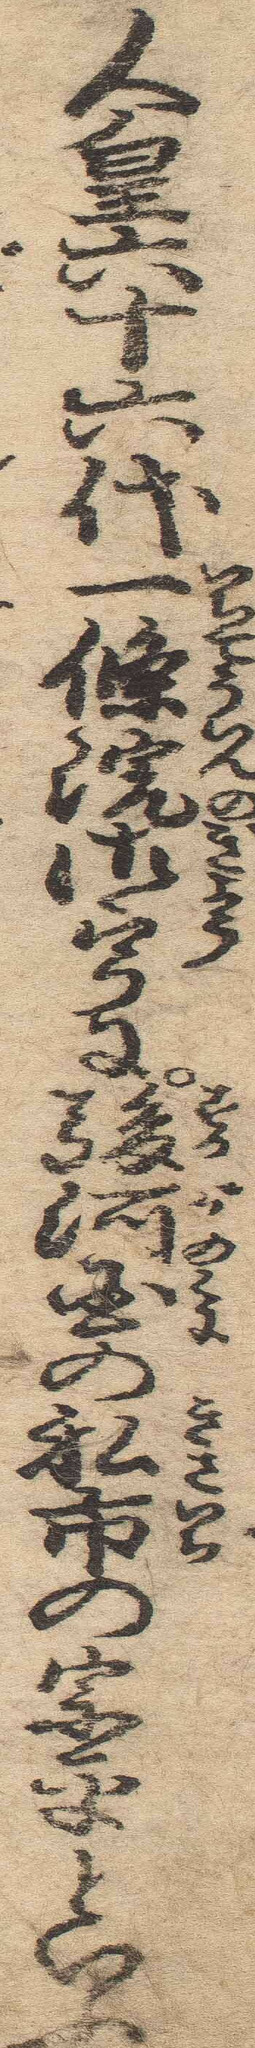人皇六十六代一條院御宇に。駿河国の私市の宗平といふ
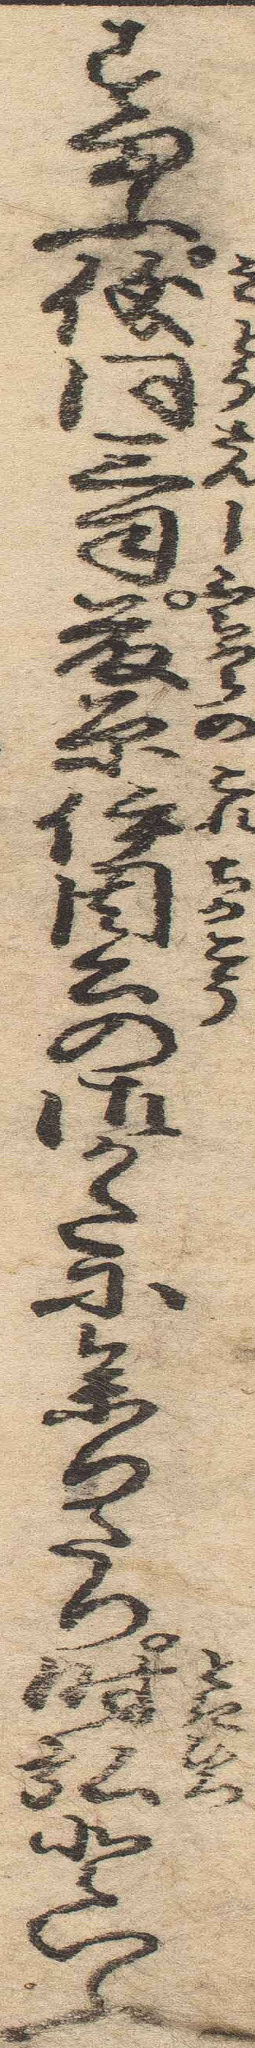すまふ。儀同三司。藤原伊周公の御かたに参りたり。時弘といふ
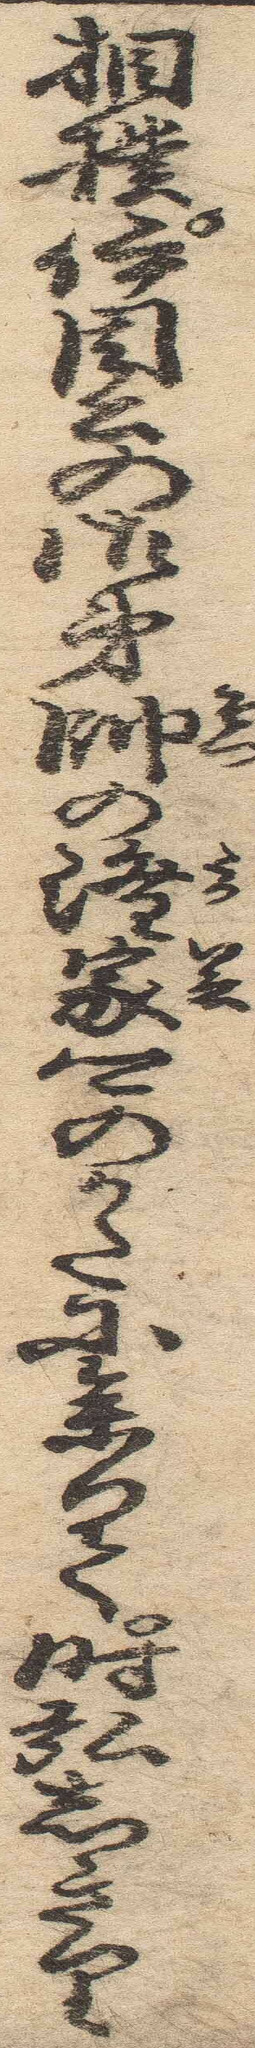相撲。伊周公の御弟師の隆家卿のかたに参りて。時弘しきり
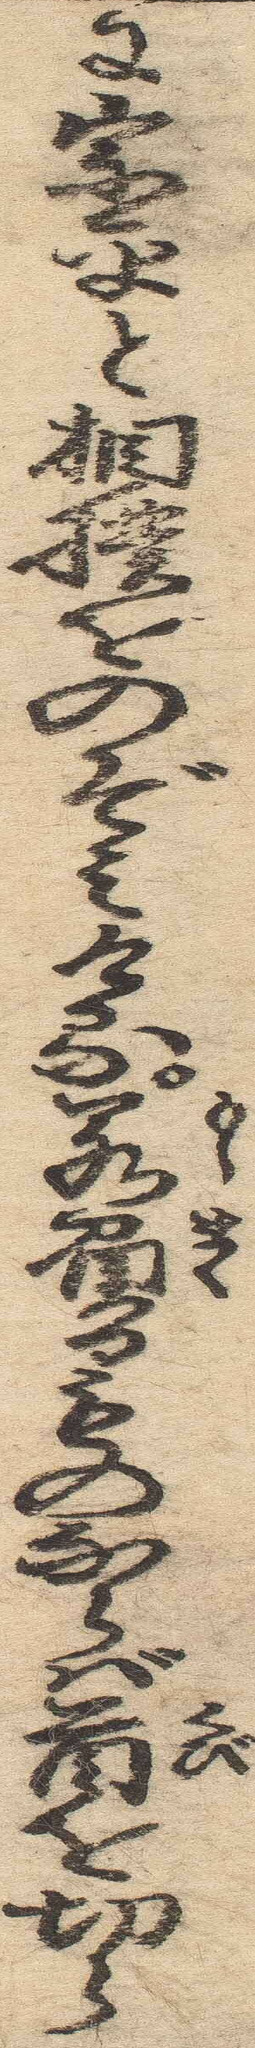に宗平と相撲をのぞみける。若負るものならば首を切ら
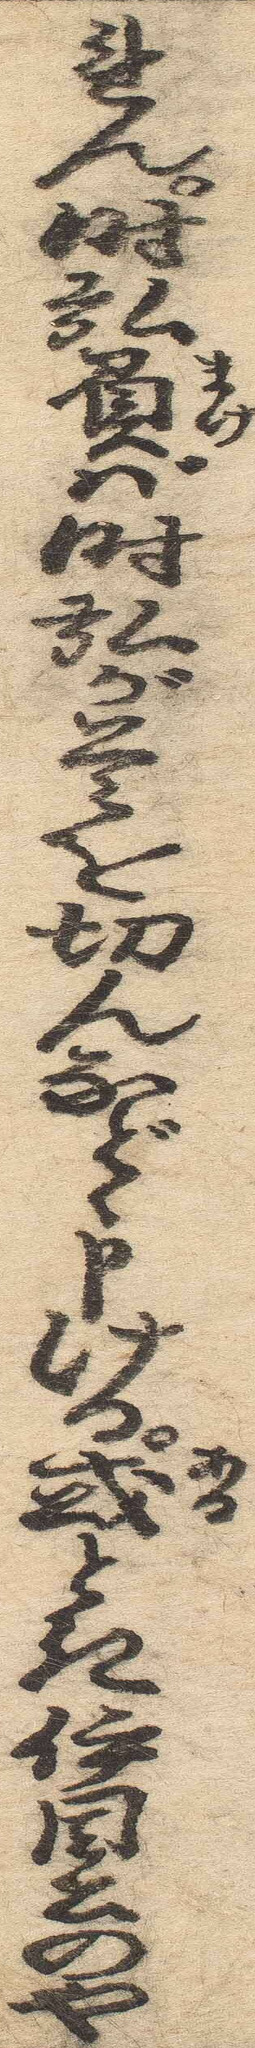れん。時弘負は時弘が首を切んなど申ける。或とき伊周公のや
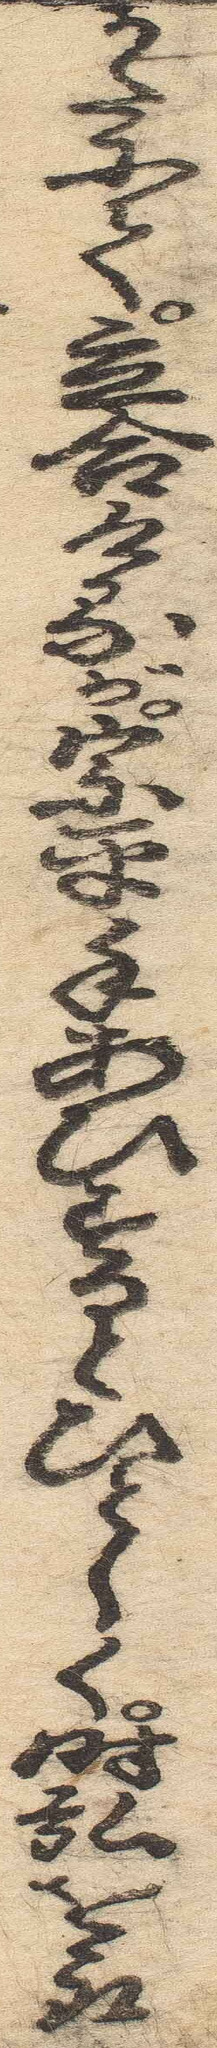かたにて。立合けるが。宗平手あひするとひとしく。時弘を取
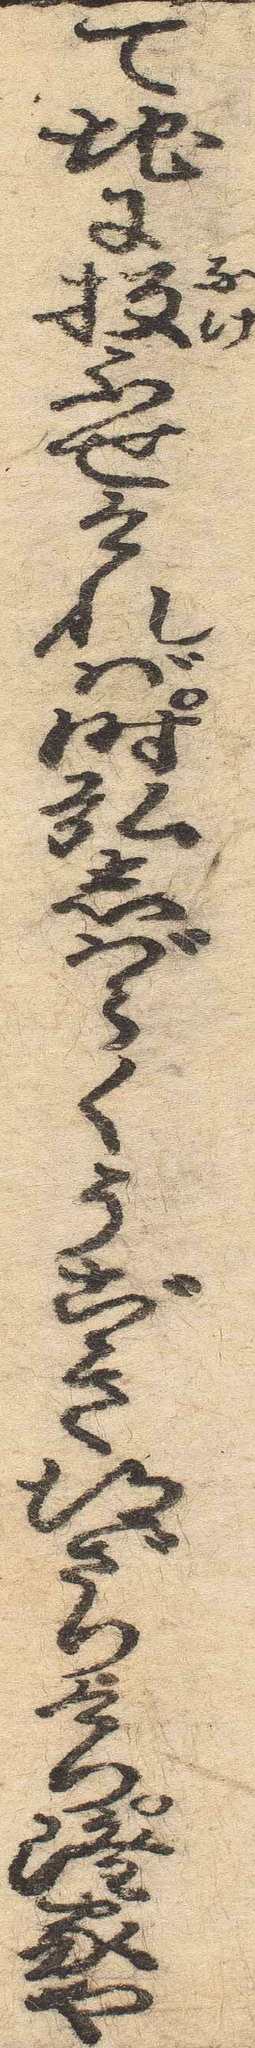て地に投ふせければ。時弘しばらくうごき得ざりけり。隆家や
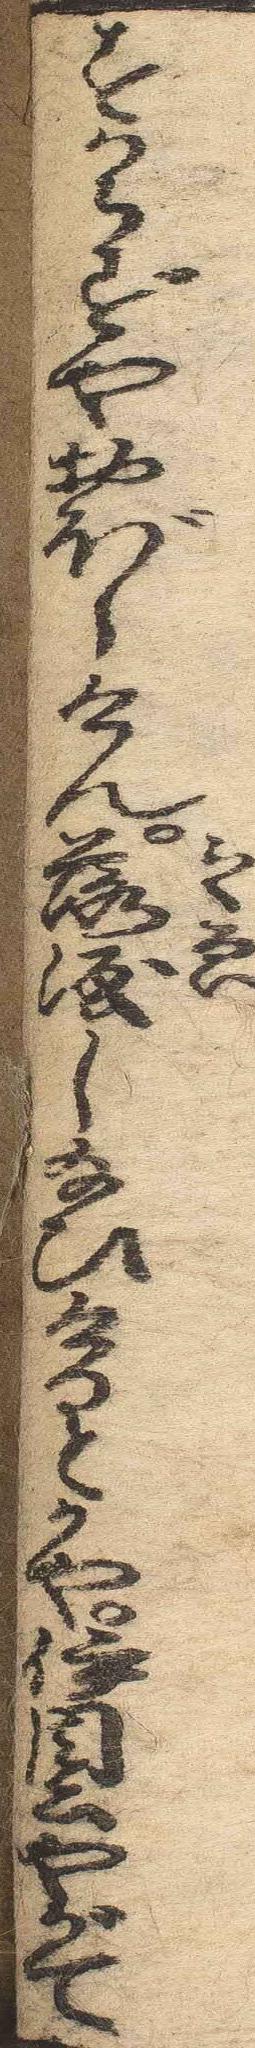すからずやおぼしけん。落涙し給ひけるとかや。伊周公やがて
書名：古今相撲大全
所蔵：東京学芸大学附属図書館 国文学研究資料館
